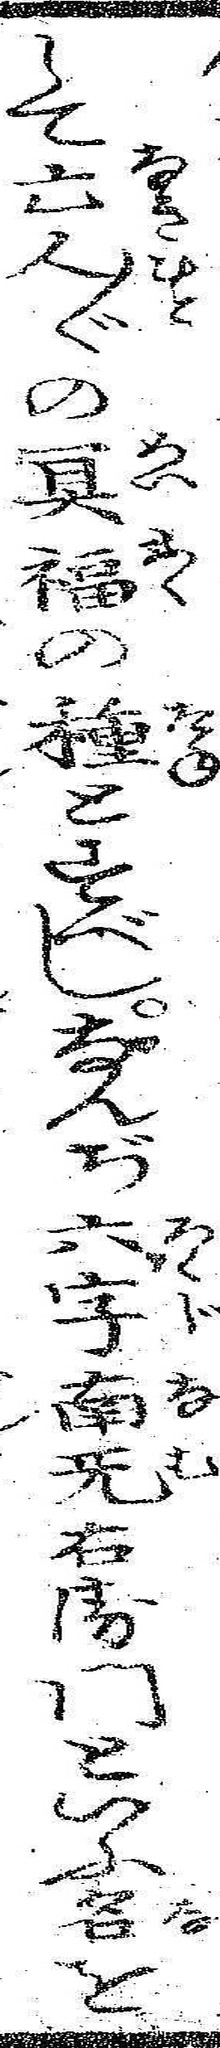して亡人の冥福の種とすべし。なんぢ六字南無右衛門といふ名を
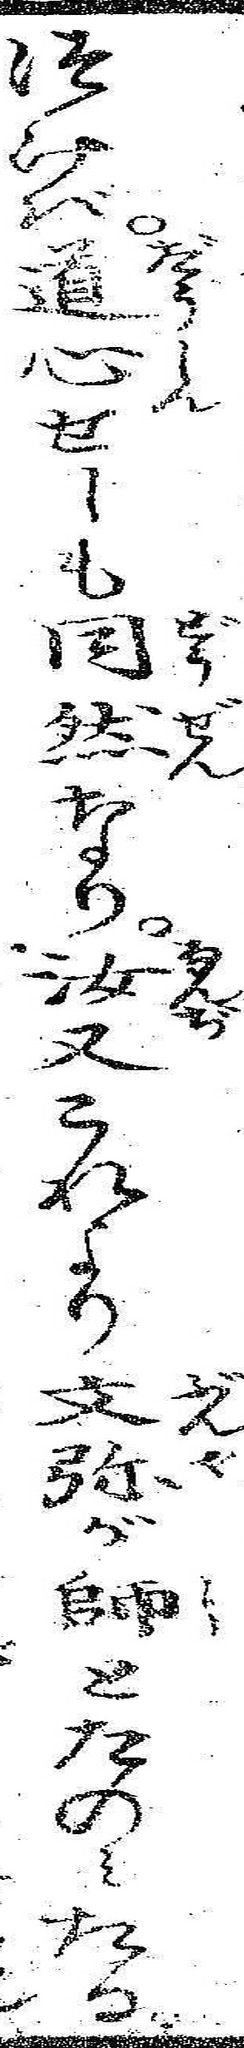つけば。道心せしも同然なり。汝又これより文弥が師とたのみたる。
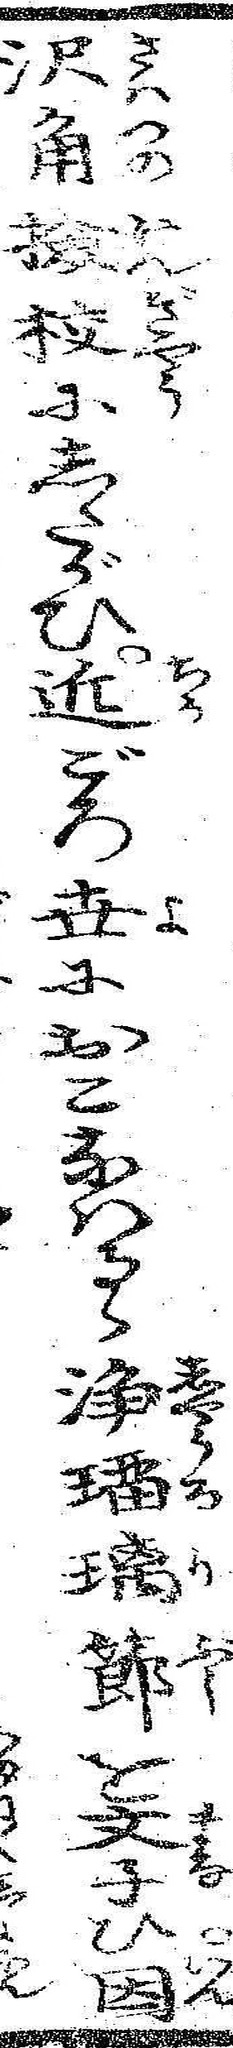沢角検校にしたがひ。近ごろ世におこなはるゝ浄瑠璃節を学ひ。因
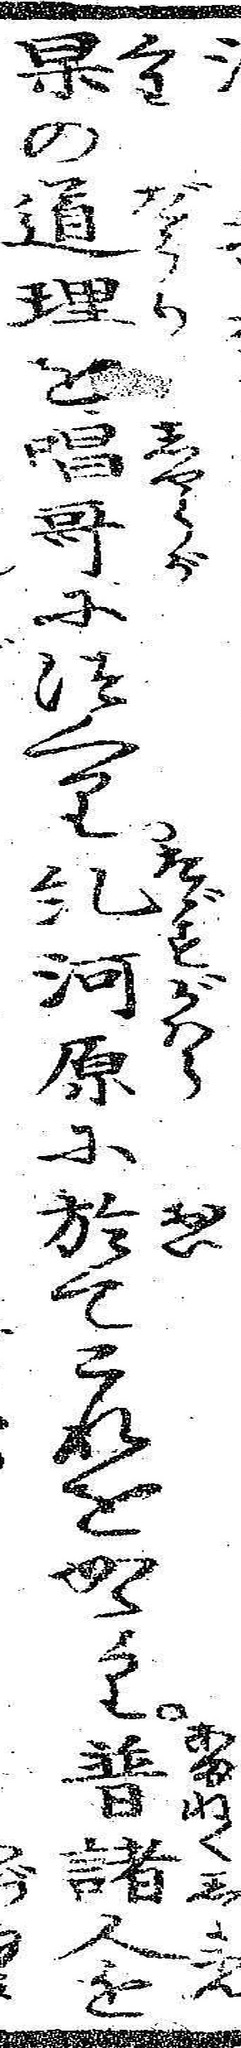果の道理を唱歌につくり。糺河原に於てこれをかたり。普諸人を
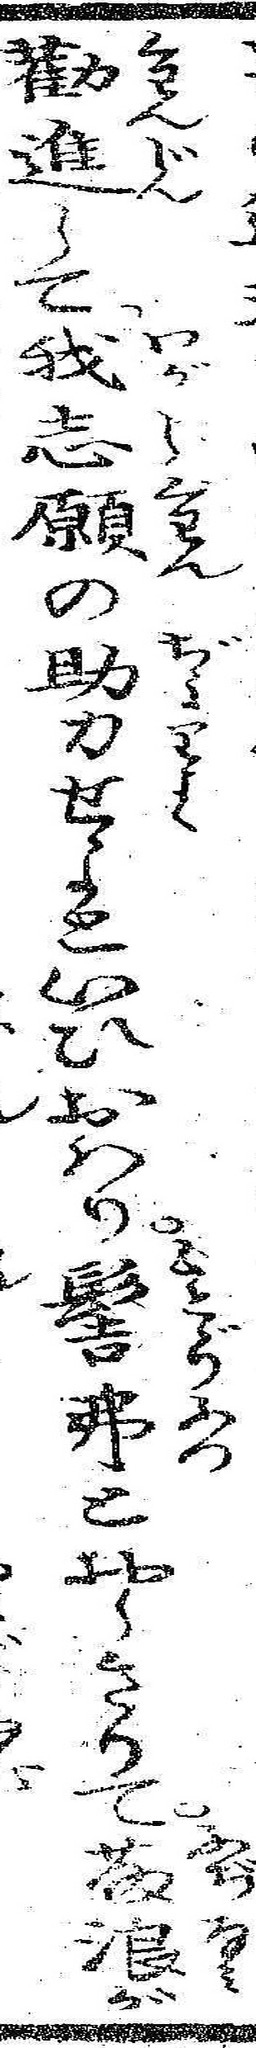勧進して。我志願の助力せよといひおはり。髻弗とおしきりて。藤浪が
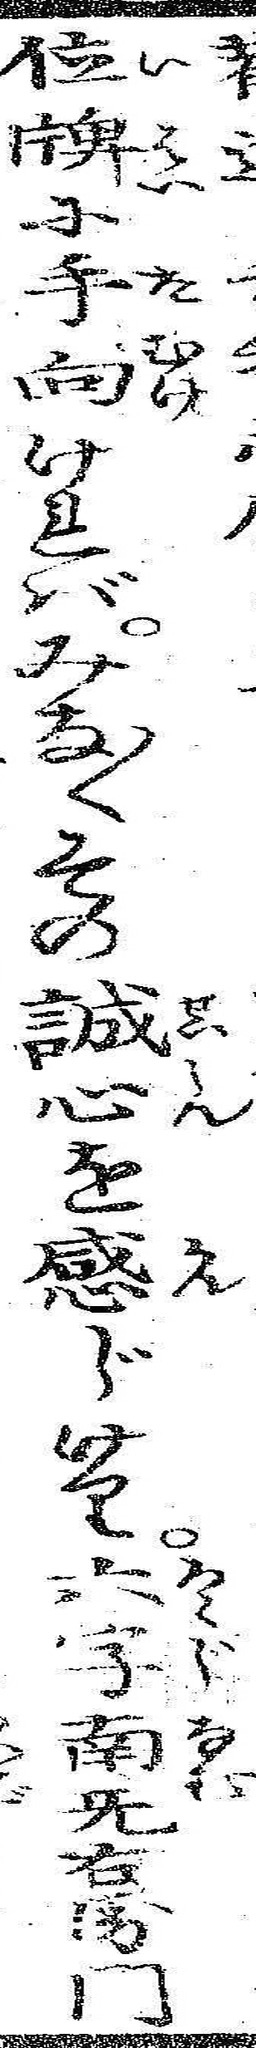位牌に手向ければ。みな〳〵その誠心を感じけり。六字南無右衛門
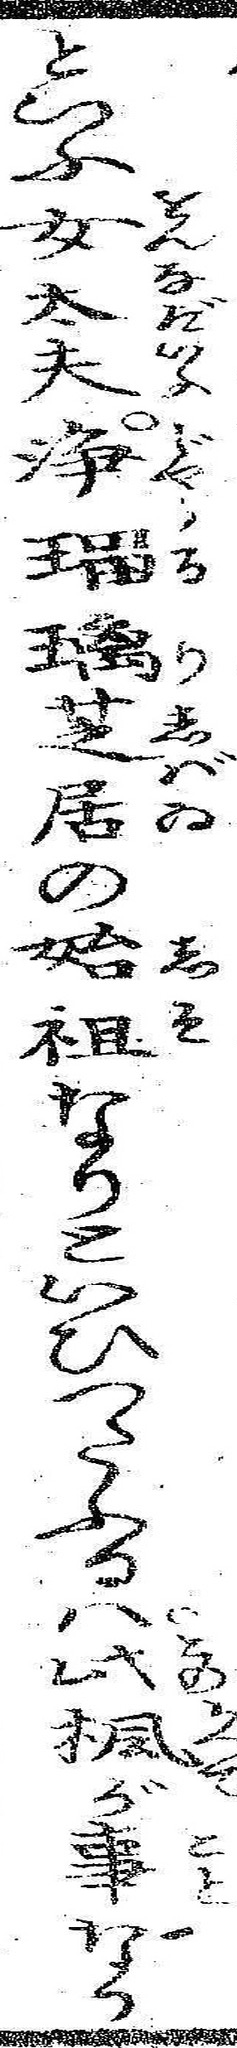といふ女太夫。浄瑠璃芝居の始祖なりといひつたふるは。此楓が事なり
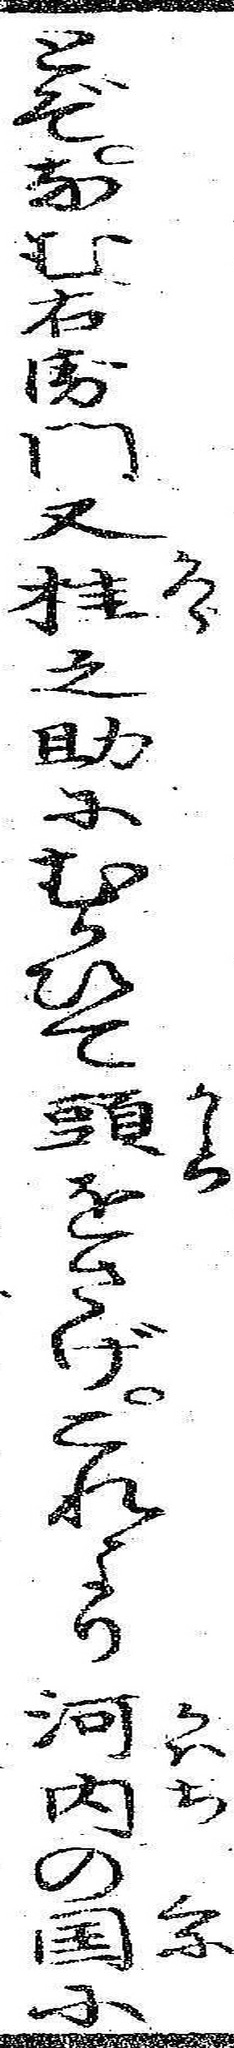とぞ。なむ右衛門又桂之助にむかひて頭をさげ。これより河内の国に
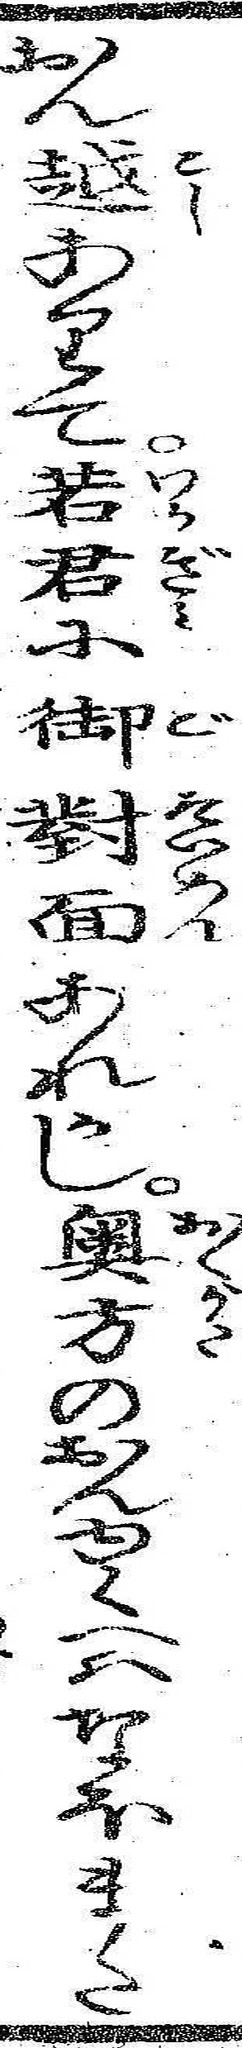おん越ありて。若君に御対面あれかし。奥方のおんゆくへはなほまた
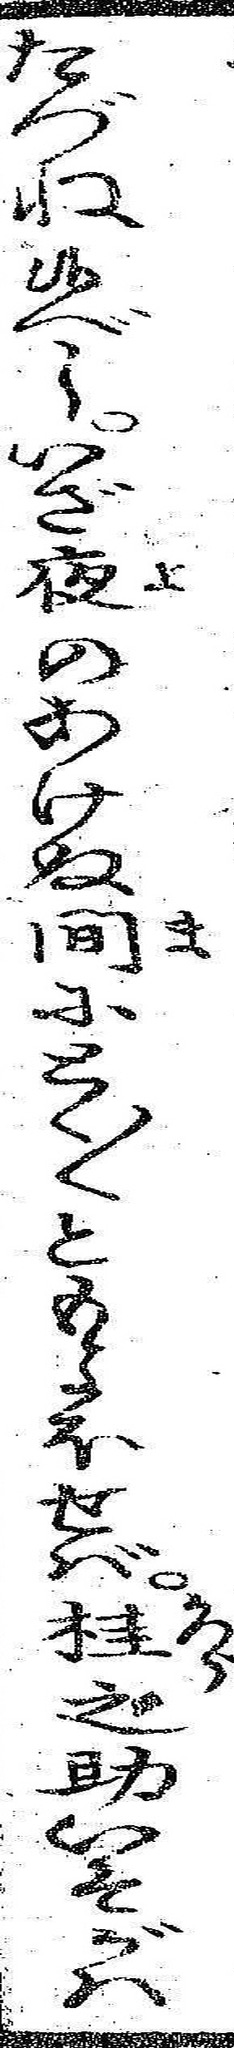たづね候べし。いざ夜のあけぬ間にとく〳〵ともよほせば。桂之助いそがは
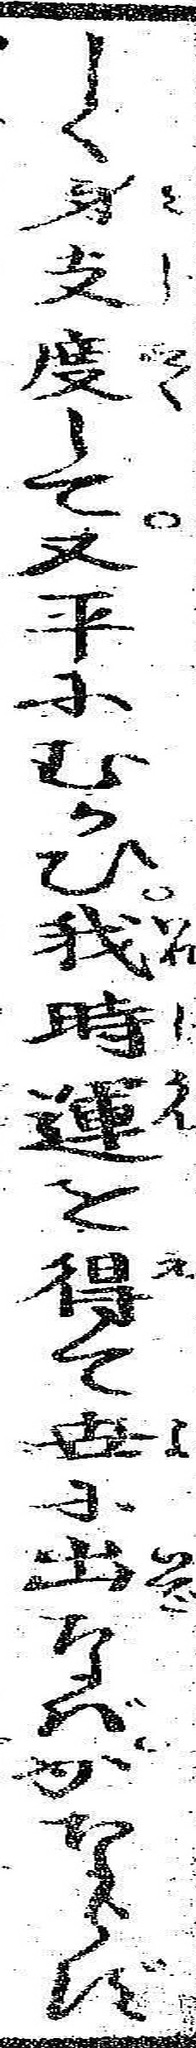しく身支度して。又平にむかひ。我時運を得て世に出なば。かならず
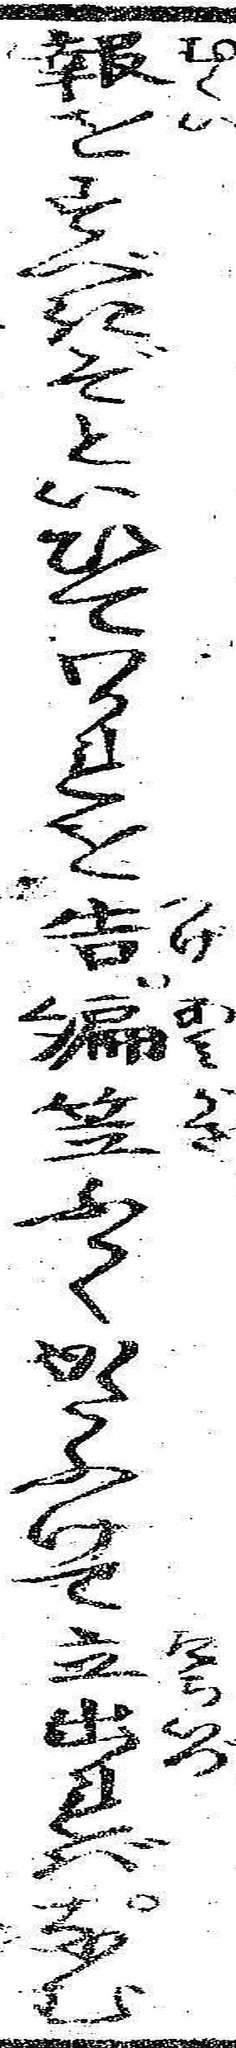報をすべきぞといひてわかれを告。編笠ふかくかたふけて立出れば。なむ
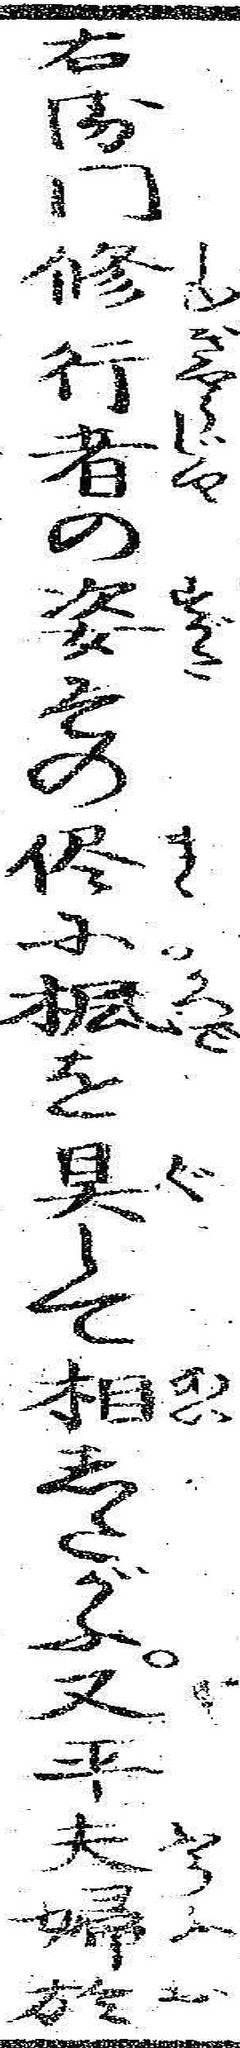右衛門修行者の姿その侭に。楓を具して相したがふ。又平夫婦於
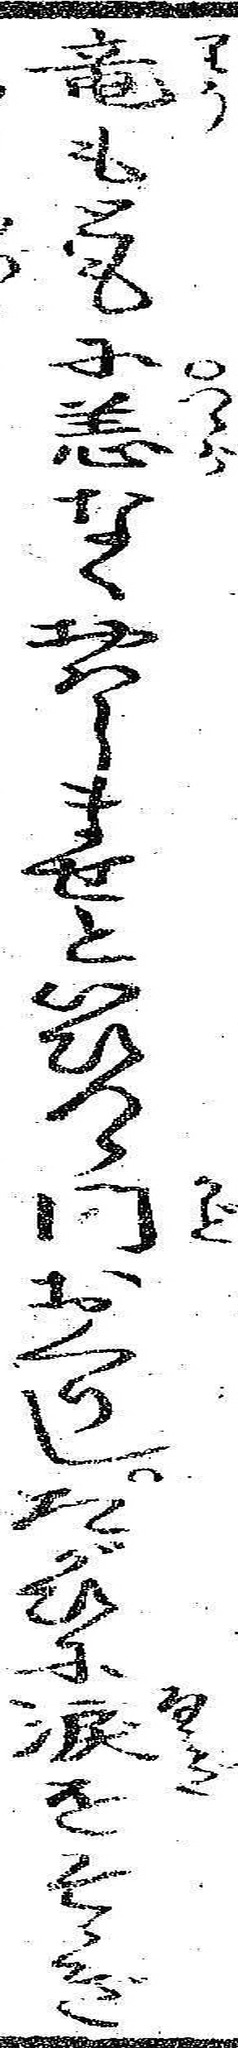竜もともに。恙なくおはしませといひつゝ門おくりし。たがひに涙をそゝぎ
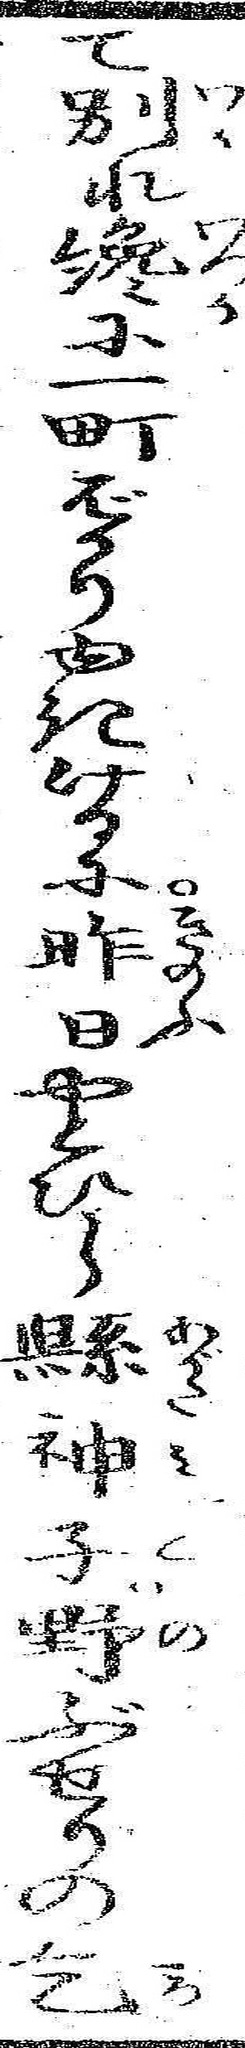て別れ纔に一町ばかりゆきけるに。昨日やとひし縣神子。野ぶせりの乞
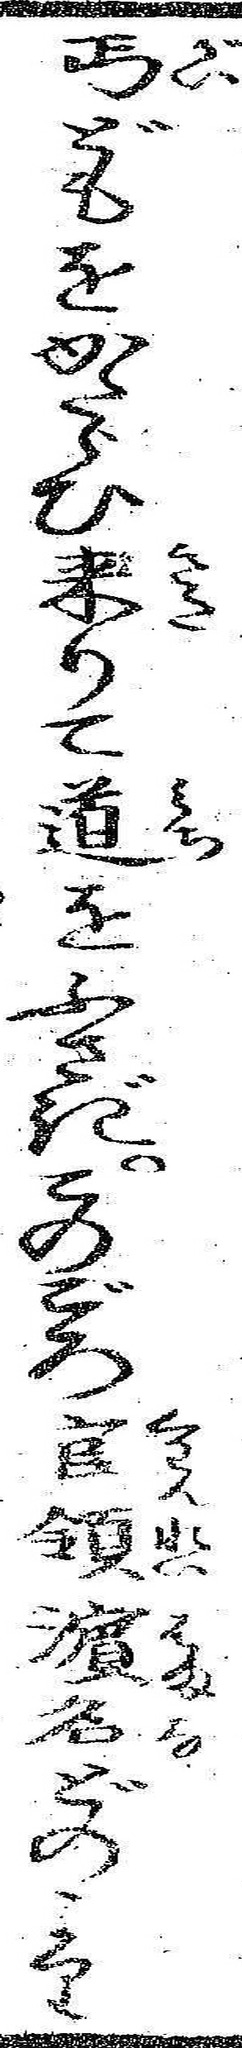丐どもをかたらひ来りて道をふさぎ。このごろ官領浜名どのより
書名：昔話稲妻表紙
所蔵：国文学研究資料館
